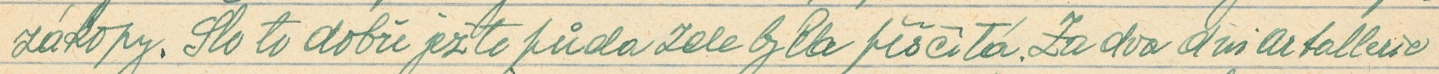zákopy. Šlo to dobře ježto půda zde byla pěščitá. Za dva dni artallerie
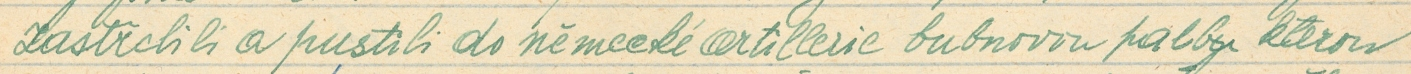zastřelili a pustili do německé artillerie bubnovou palbu kterou
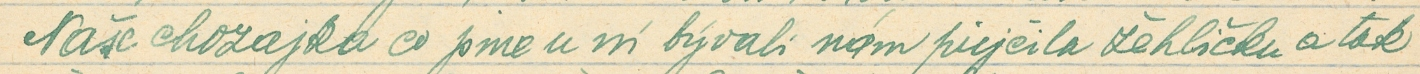Naše chozajka co jsme u ní bývali nám půjčila žehličku a tak
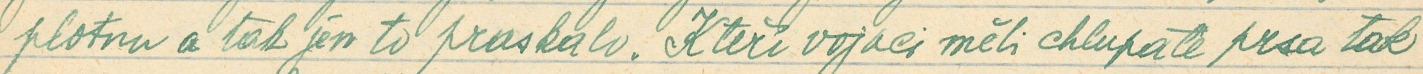plotnu a tak jen to praskalo. Kteří vojáci měli chlupaté prsa tak
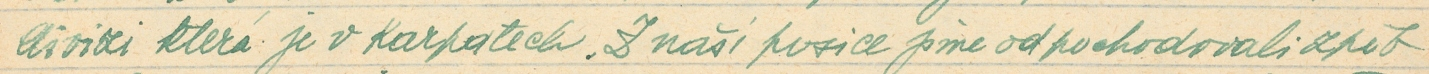divizi která je v Karpatech. Z naší posice jsme odpochodovali zpět
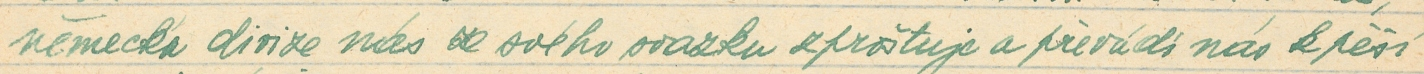německá divize nás ze svého svazku zproštuje a převádí nás k pěší
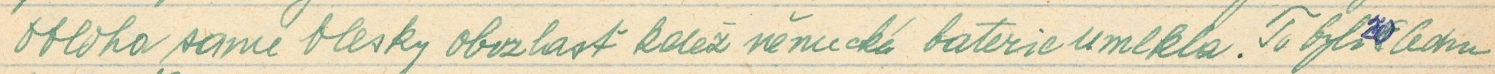obloha samé blesky obvzlasť kdež německá baterie umlkla. To bylo 30 ledna
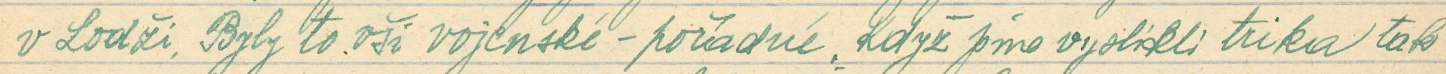v Lodži. Byly to vši vojenské - pořádné. Když jsme vyslíkli trika tak
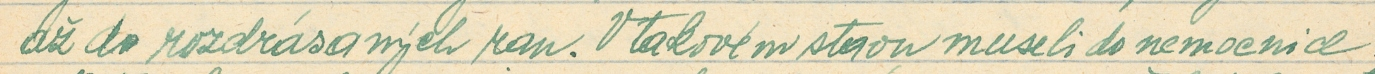až do rozdrásaných ran. V takovém stavu museli do nemocnice.
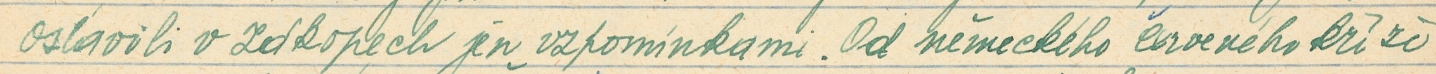oslavili v zákopech jen vzpomínkami. Od německého červeného kříže
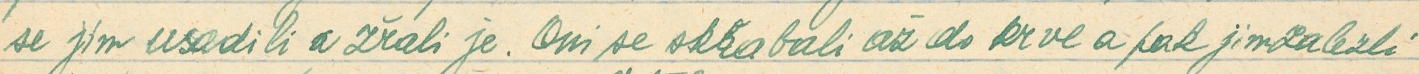se jím usadili a žrali je. Oni se skrabali až do krve a pak jim zalezli
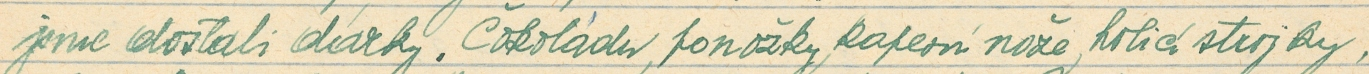jsme dostali dárky. Čokoládu, ponožky, kapesní nože, holicí strojky;
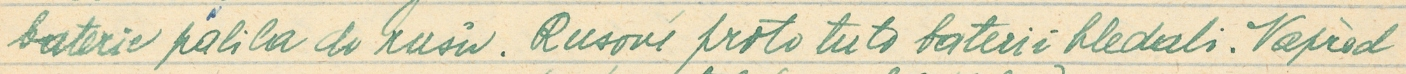baterie plálila do rusů. Rusové proto tuto baterii hledali. Napřed
